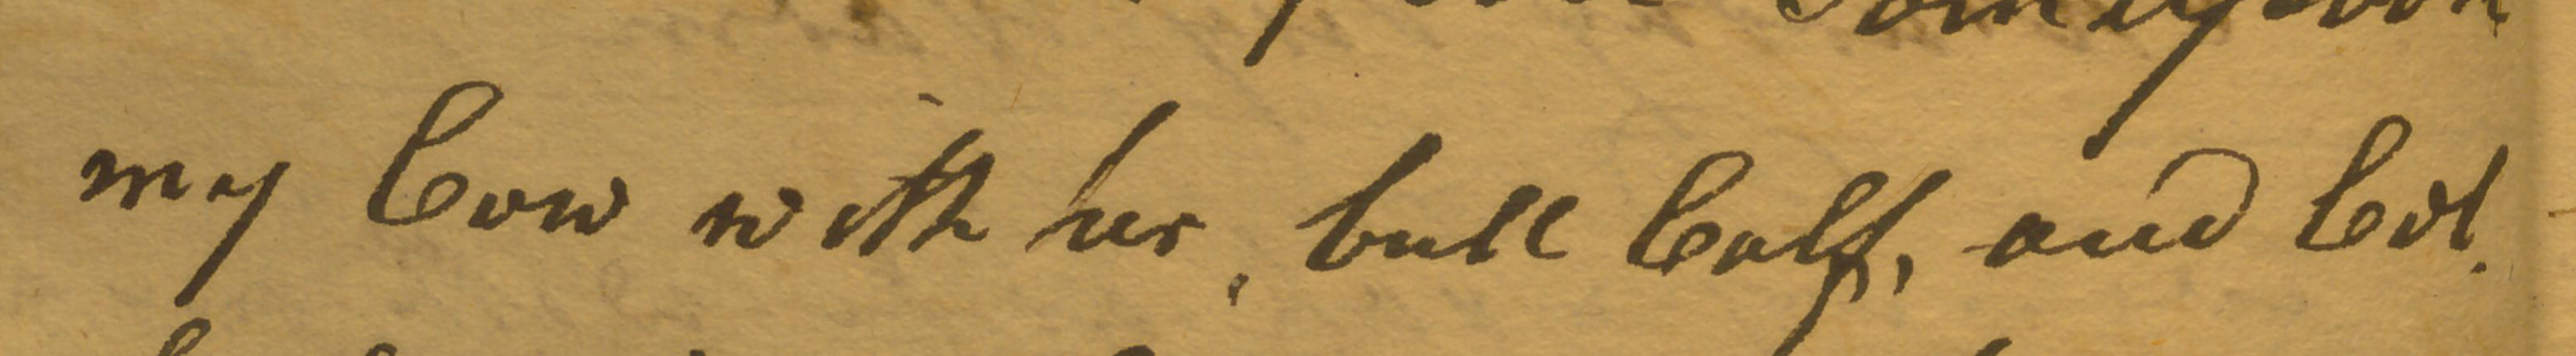my Cow with her bull Calf, and Col
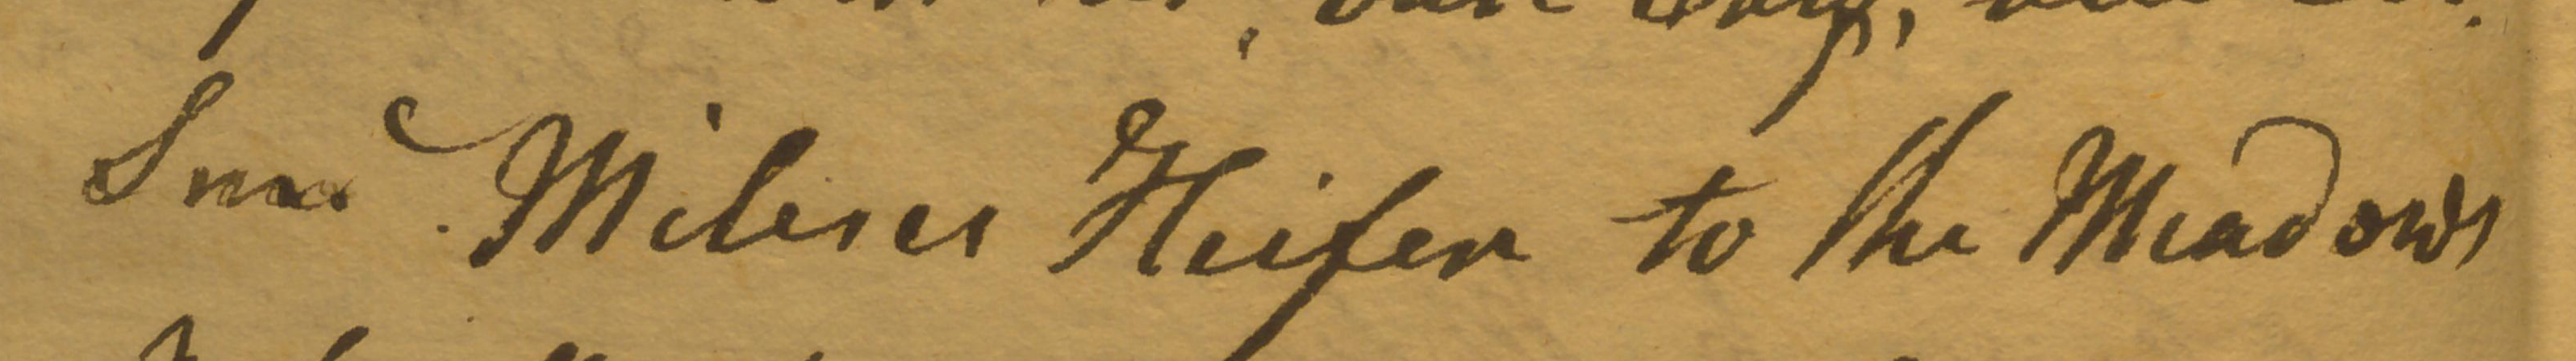Sm Mileses Heifer to the Meadows
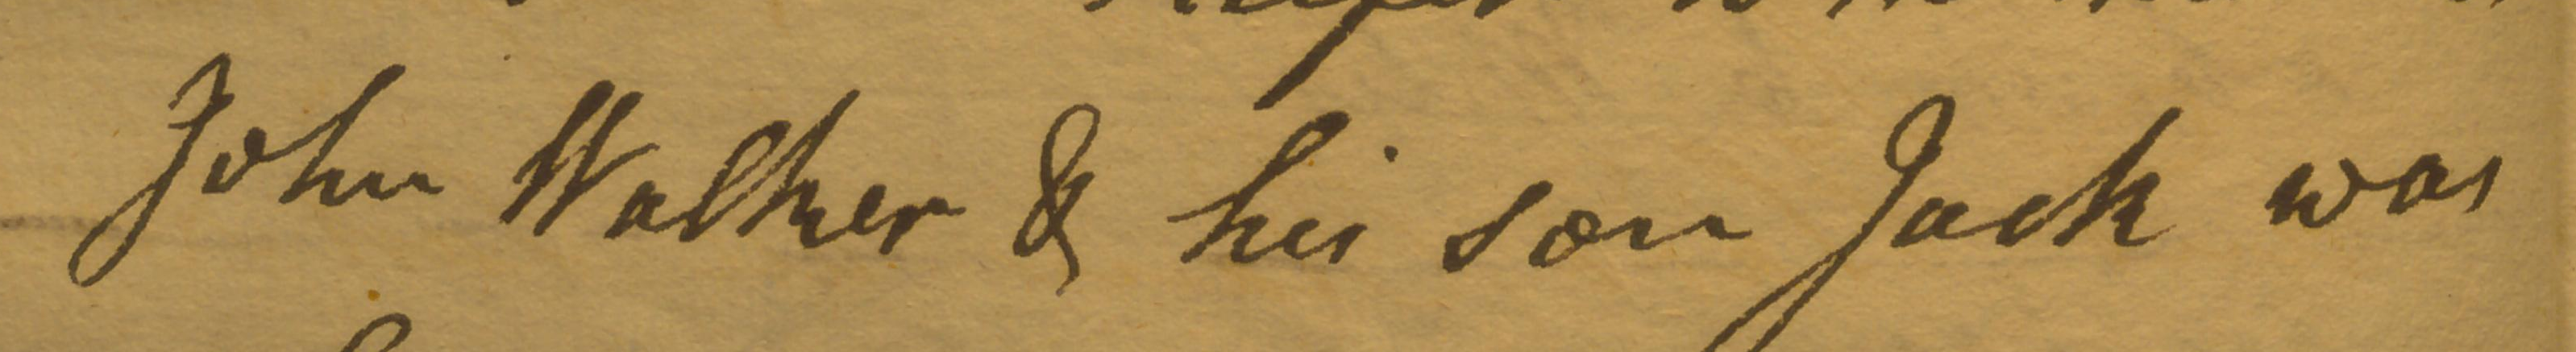John Walker & his son Jack was
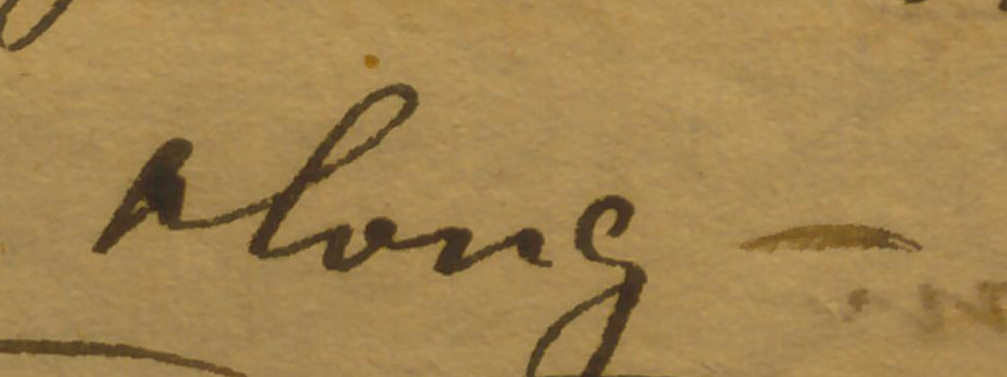along-
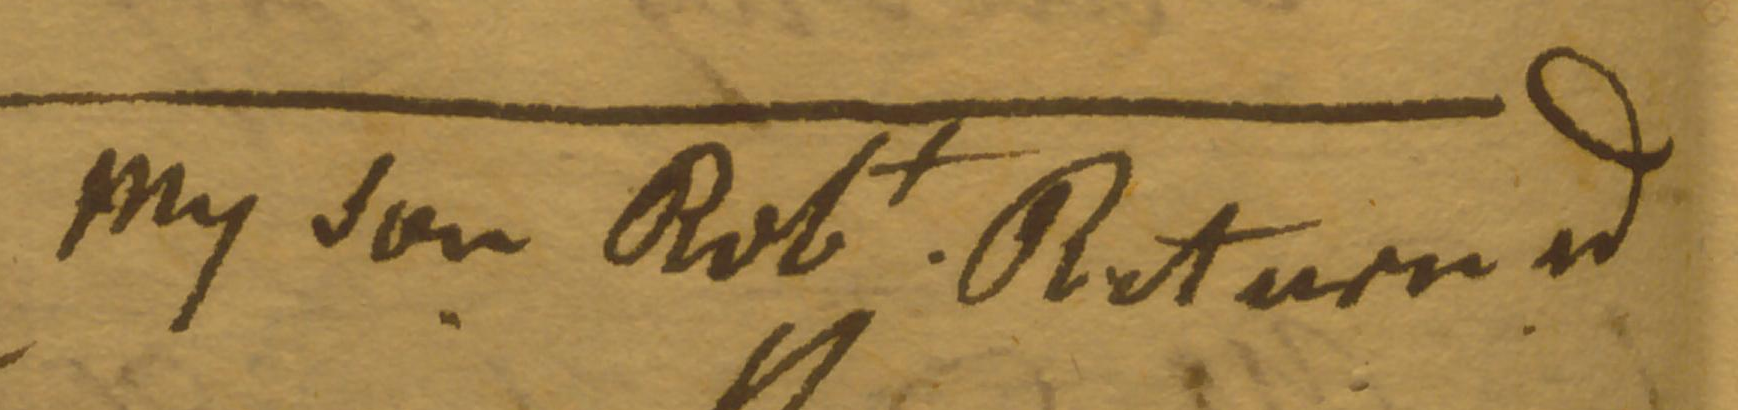my son Rob^t. Returned
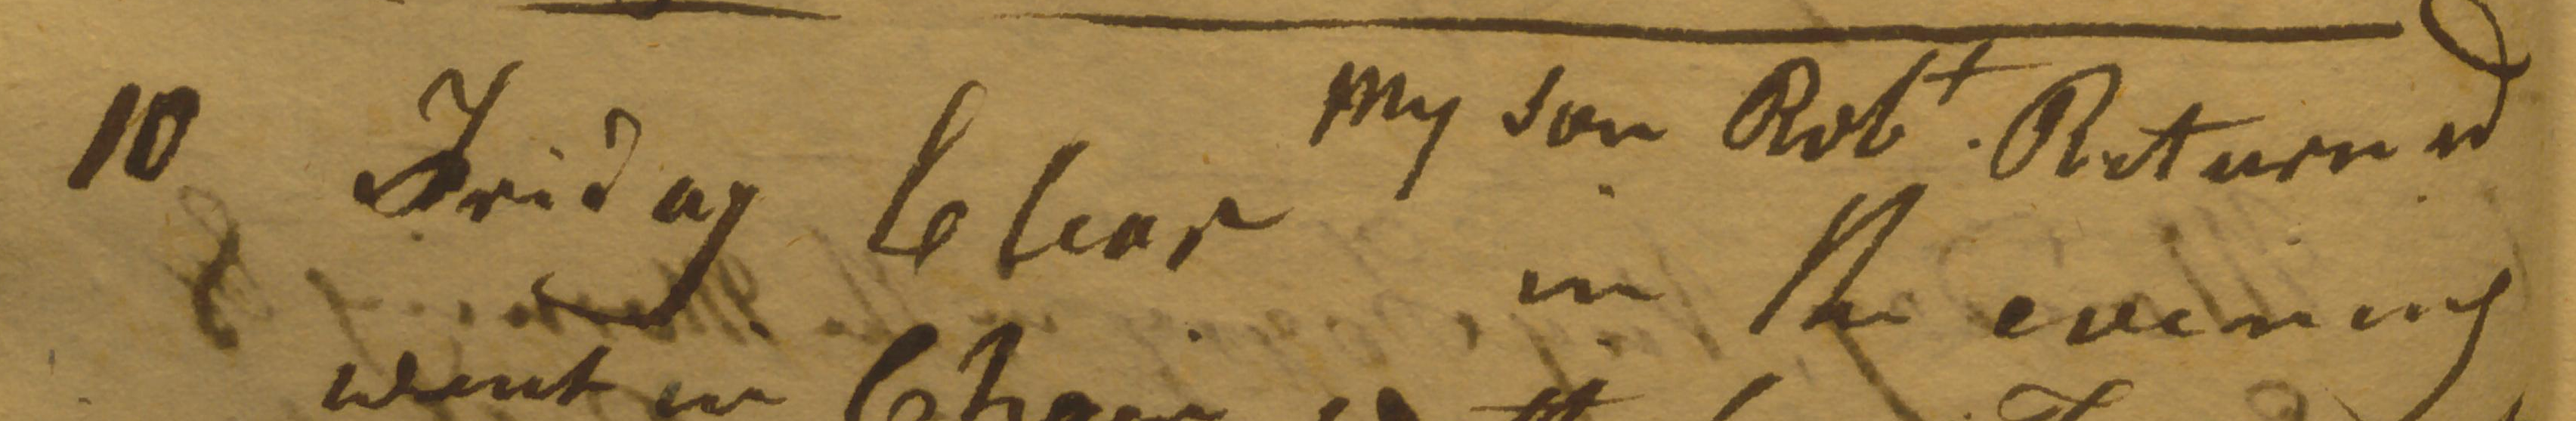10 Friday Clear in the evening
